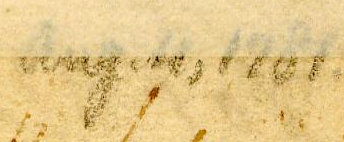imngeresteon
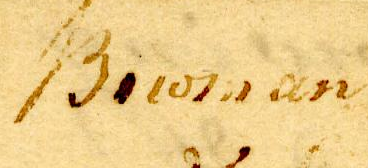Bowman
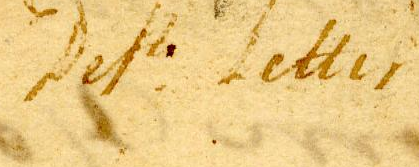Def^t. Letter
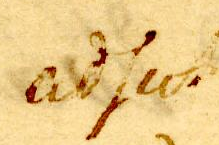answ^d
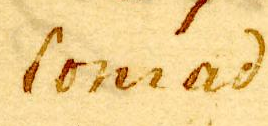Conrad
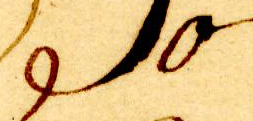To
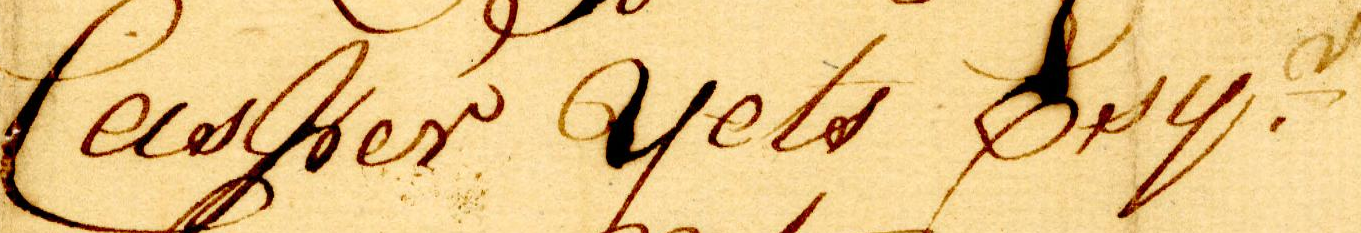Casper Yets Esq^r
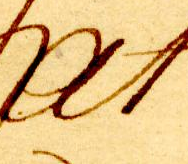at
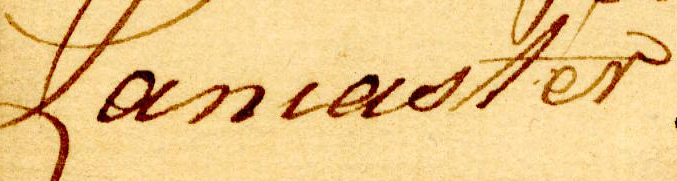Lancaster
